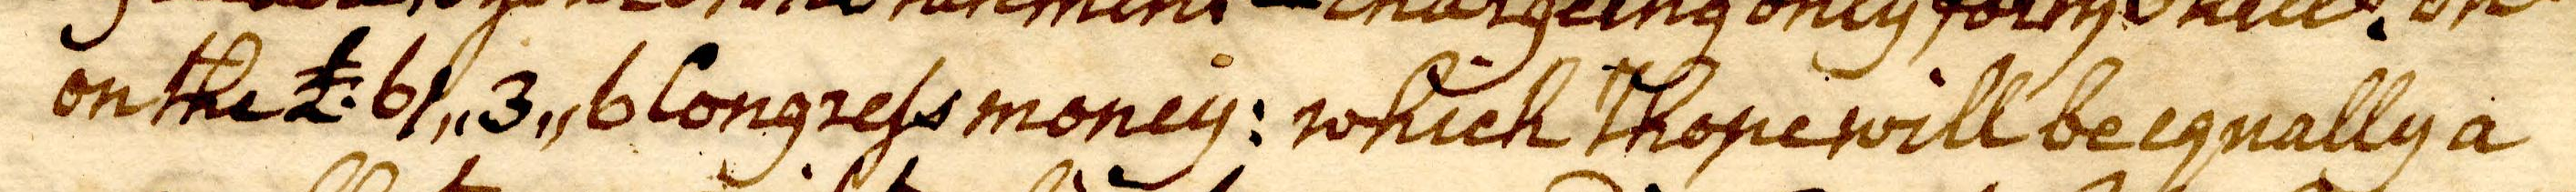on the £61..3..6 Congress money: which I hope will be equally a
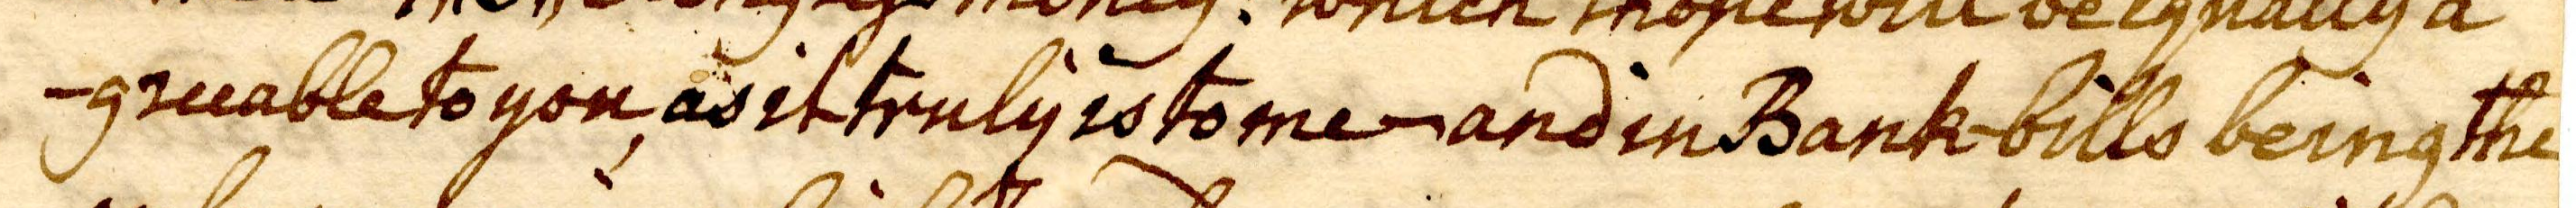-greeable to you, as it truly is to me- and in Bank bills being the
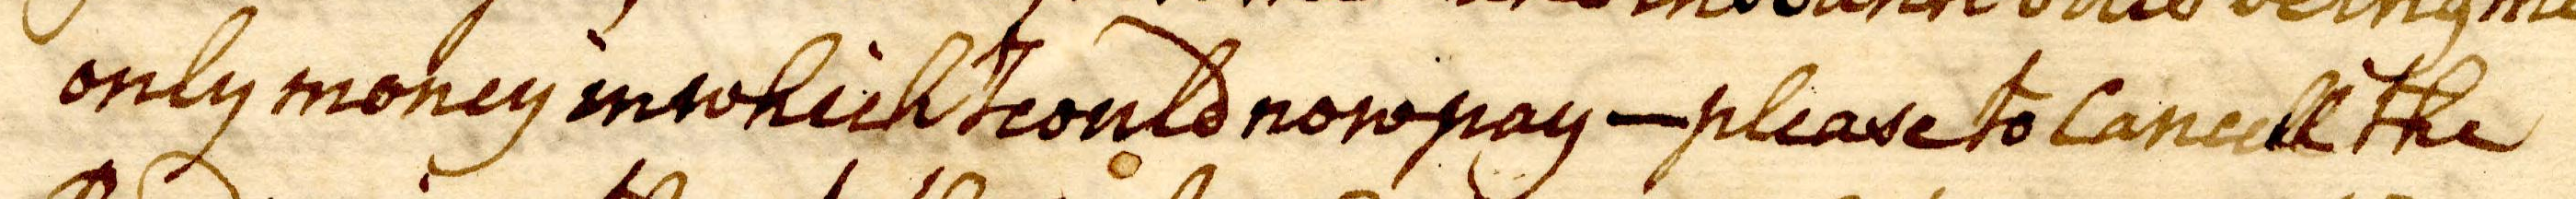only money in which I could now pay- please to Cancell the
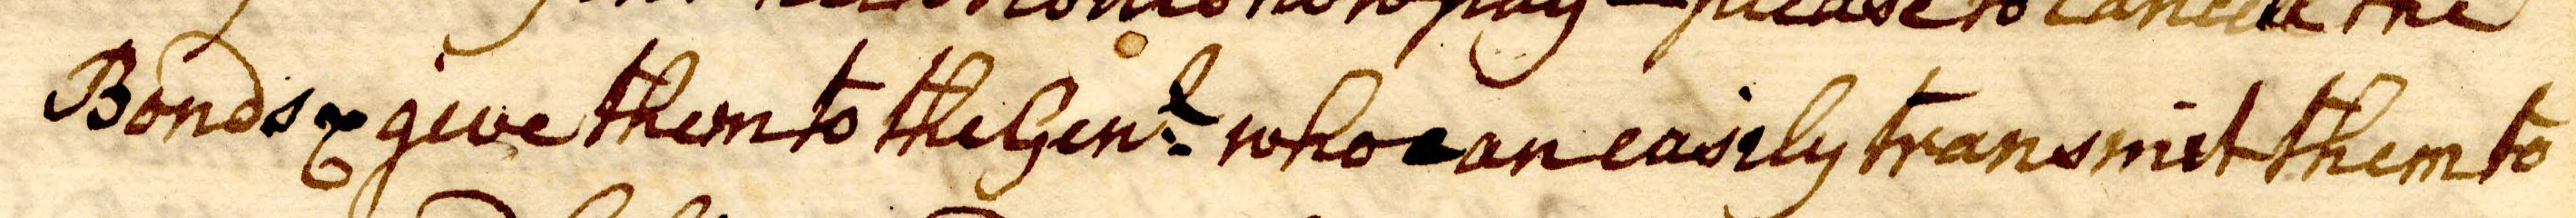Bonds & give them to the Gen^l. who can easily transmit them to
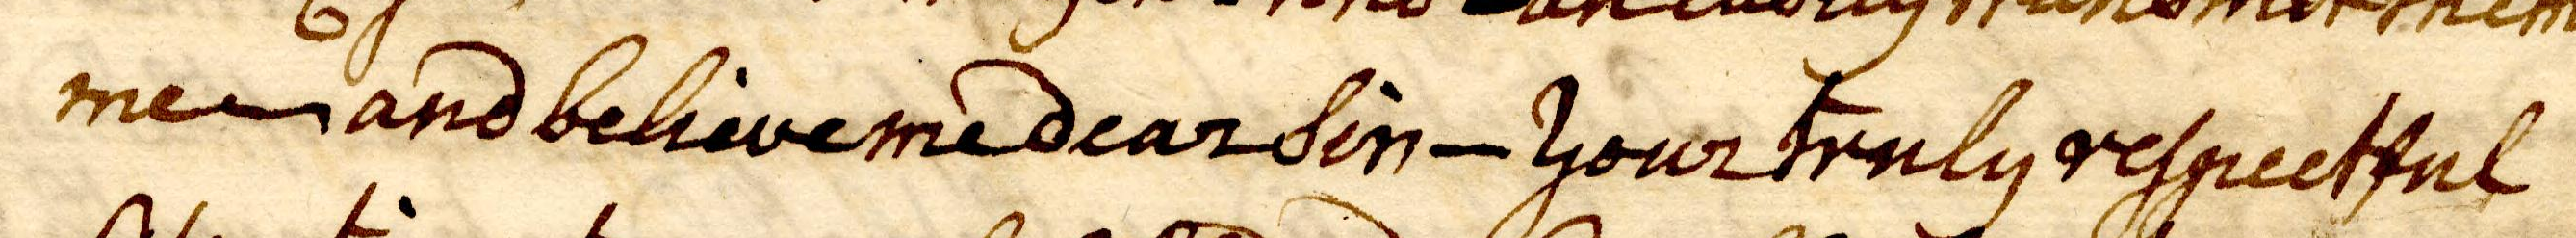me- and believe me dear Sir- Your truly respectful
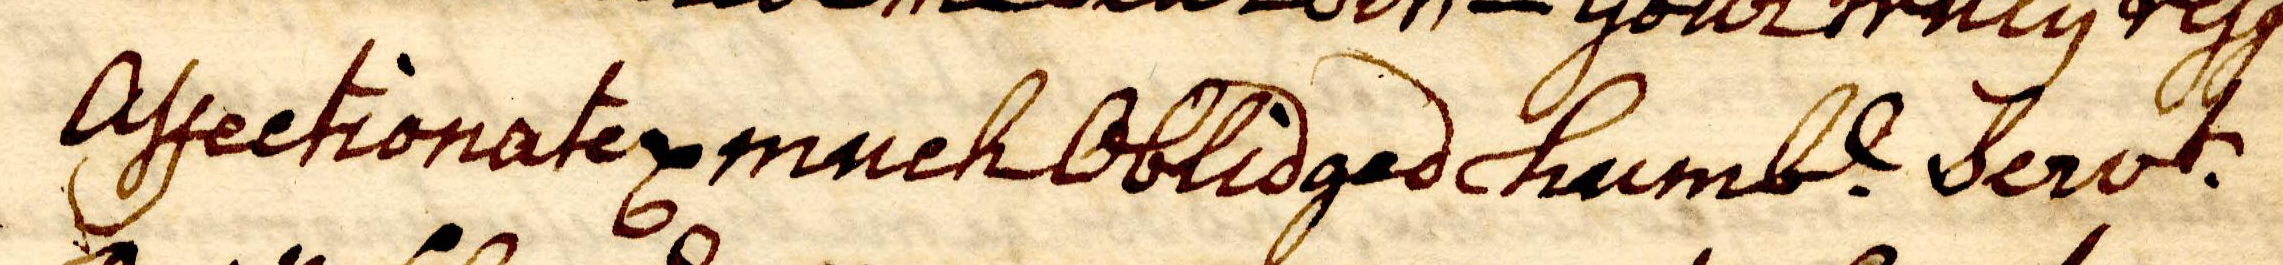Affectionate & much Oblidged humb^l. Serv^t.
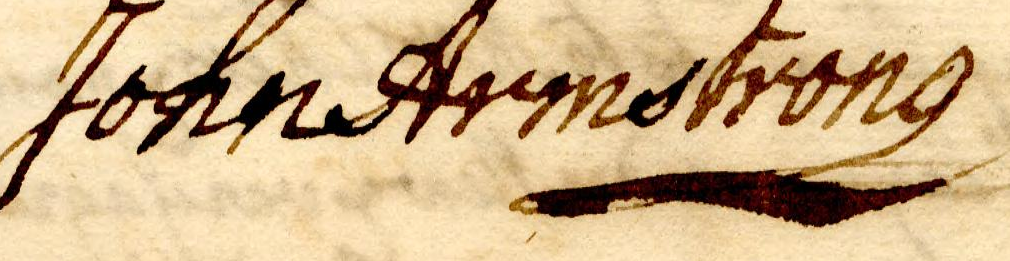John Armstrong
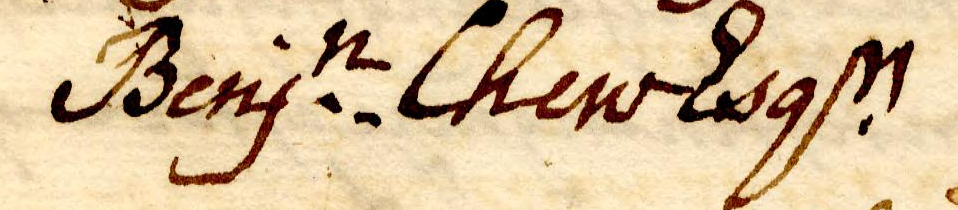Benj^n. Chew Esq^r.
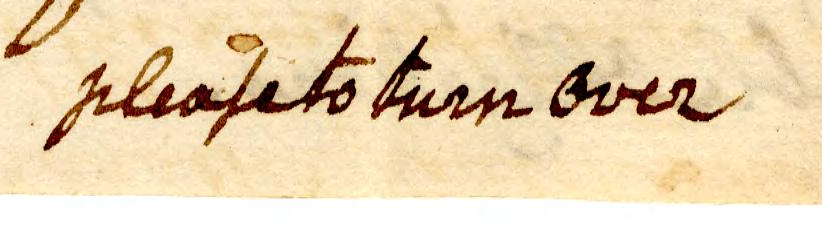please to turn over
